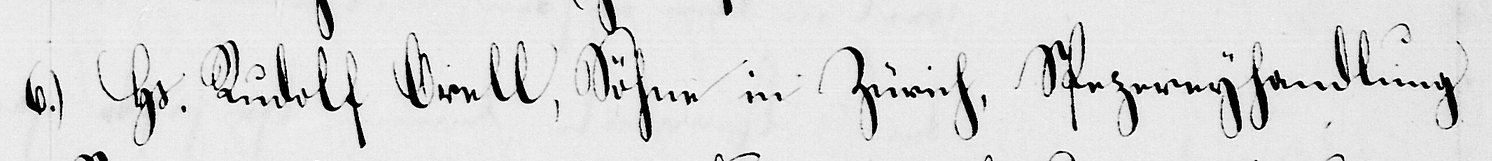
6.) Hs. Rudolf Orell, Söhne in Zürich, Spezereyhandlung
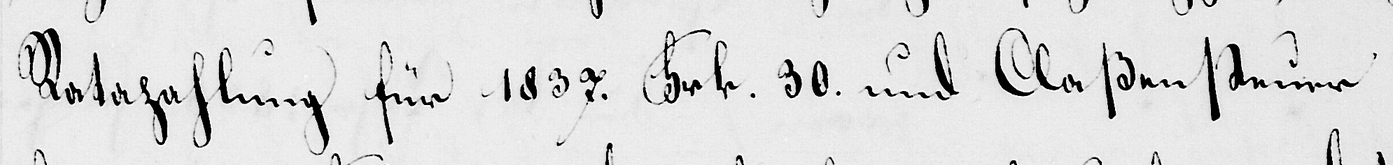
Ratazahlung für 1837. Frk. 30. und Claßensteuer
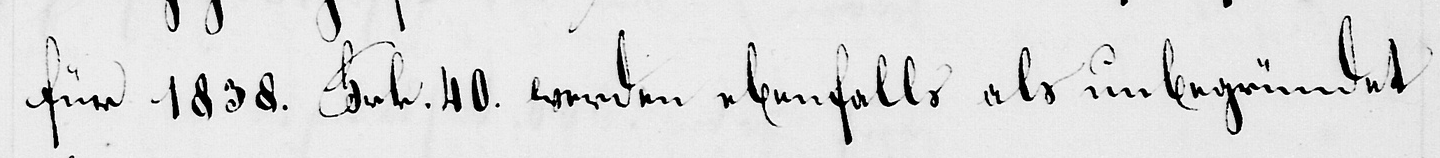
für 1838. Frk. 40. werden ebenfalls als unbegründet
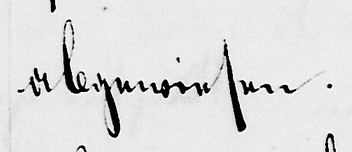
abgewiesen.
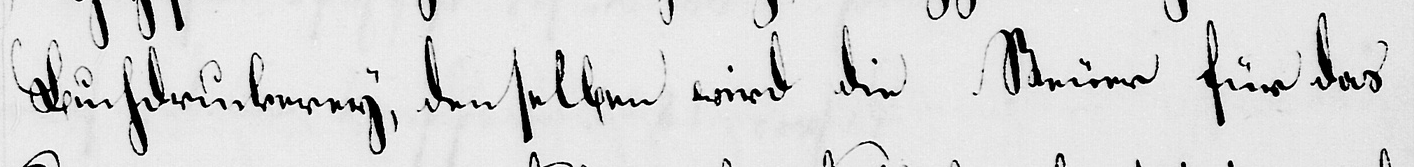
Buchdruckerey, denselben wird die Steuer für das
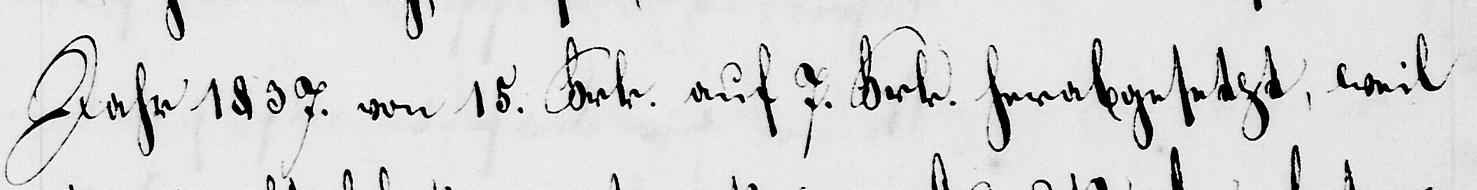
Jahr 1837. von 15. Frk. auf 7. Frk. herabgesetzt, weil
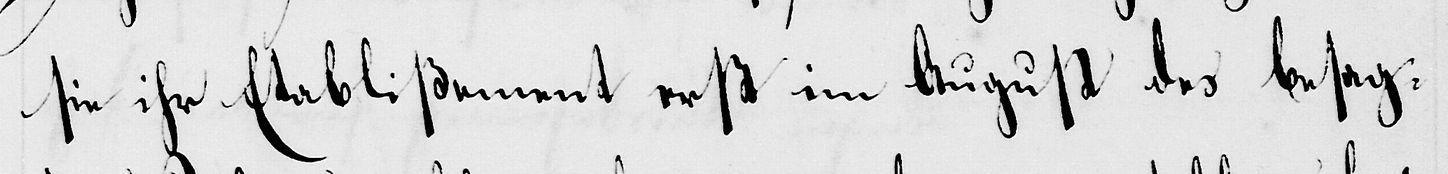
sie ihr Etablißement erst im August des besag¬
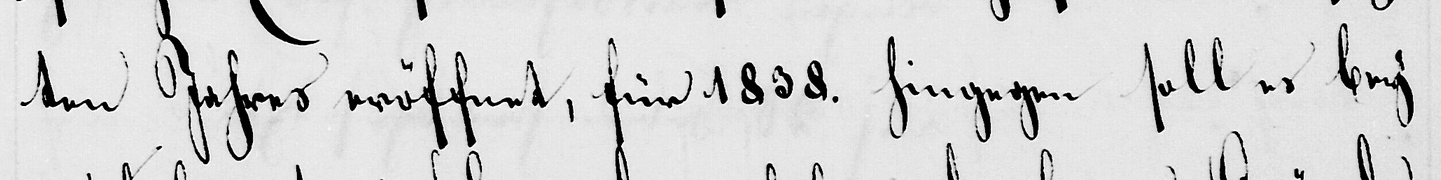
ten Jahres eröffnet, für 1838. hingegen soll es bey
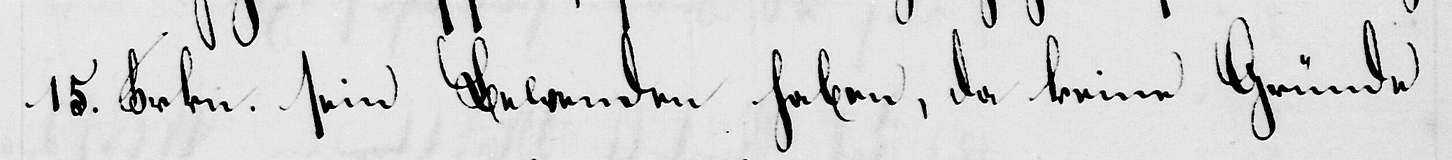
15. Frkn. sein Bewenden haben, da keine Gründe
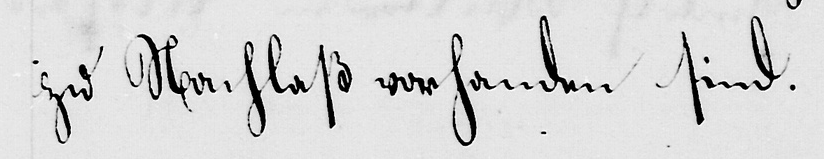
zu Nachlaß vorhanden sind.
